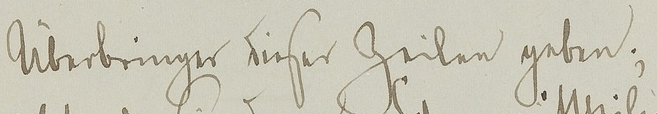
Überbringer dieser Zeilen geben;
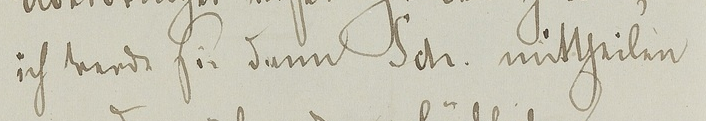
ich werde sie dann Sch. mittheilen
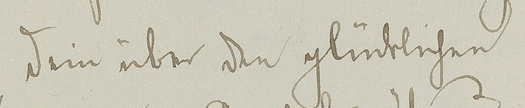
Dein über den glücklichen
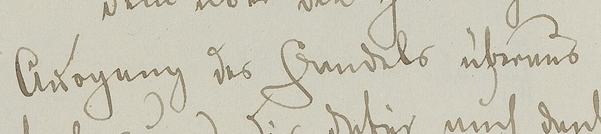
Ausgang des Handels überaus
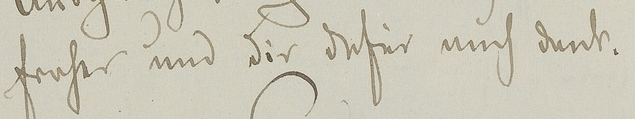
froher und dir dafür auch dank-
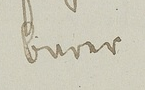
barer
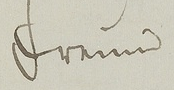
Freund
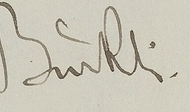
Bürkli.
